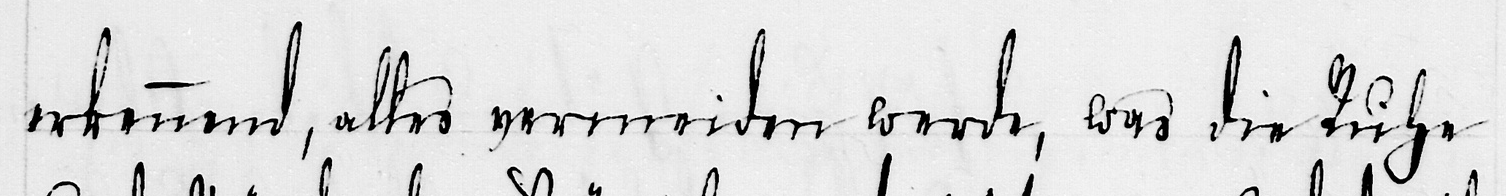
erkennend, alles vermeiden werde, was die Ruhe
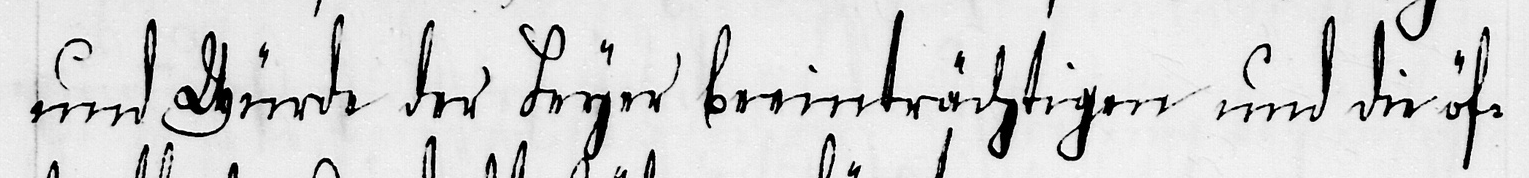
und Würde der Feyer beeinträchtigen und die öf¬
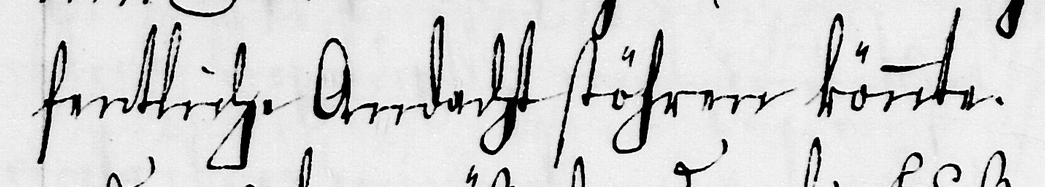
fentliche Andacht stöhren könnte.
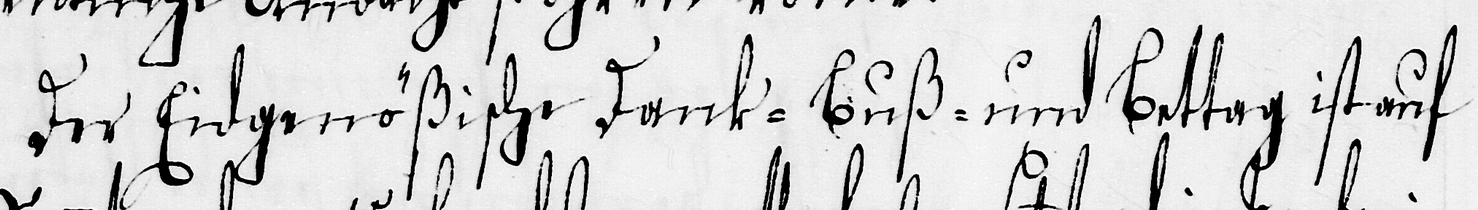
Der Eidgenößische Dank- Buß- und Bettag ist auf
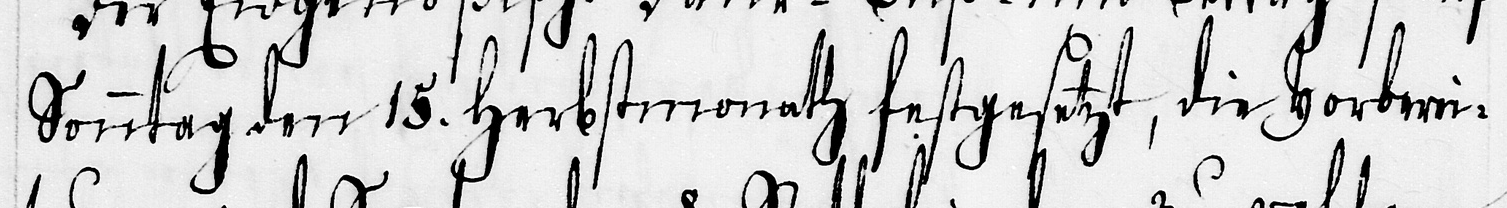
Sonntag den 15. Herbstmonath festgesetzt, die Vorberei¬
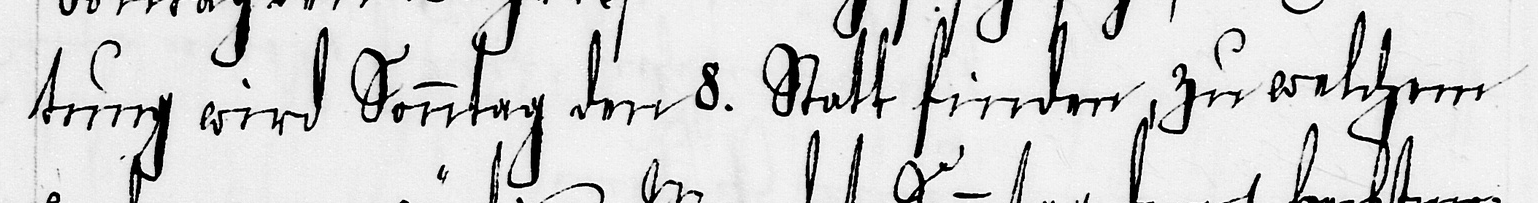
tung wird Sonntag den 8. Statt finden, zu welchem
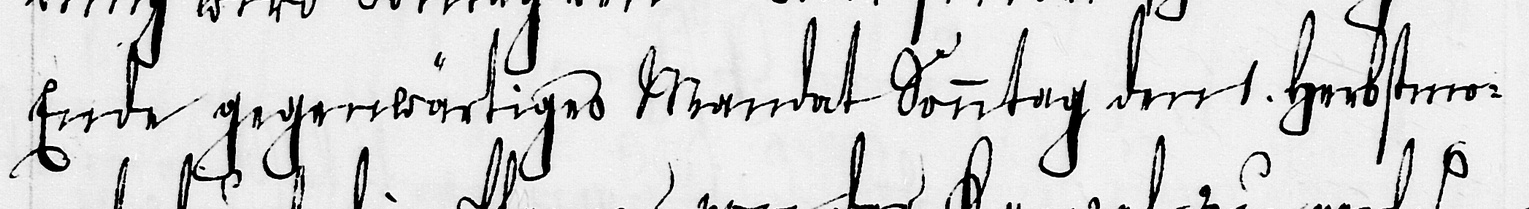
Ende gegenwärtiges Mandat Sonntag den 1. Herbstmo¬
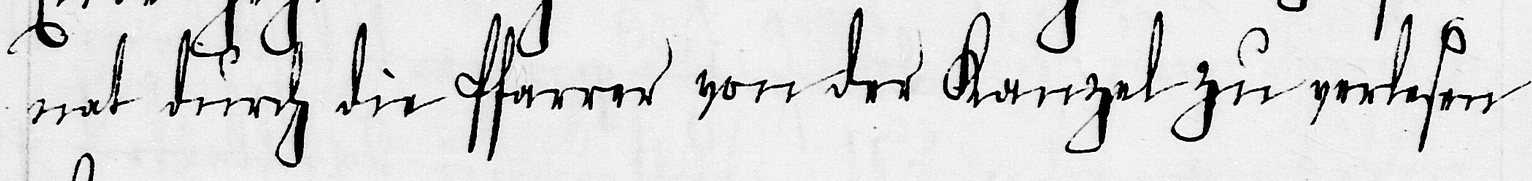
nat durch die Pfarrer von der Kanzel zu verlesen
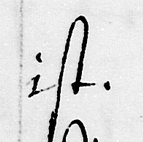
ist.
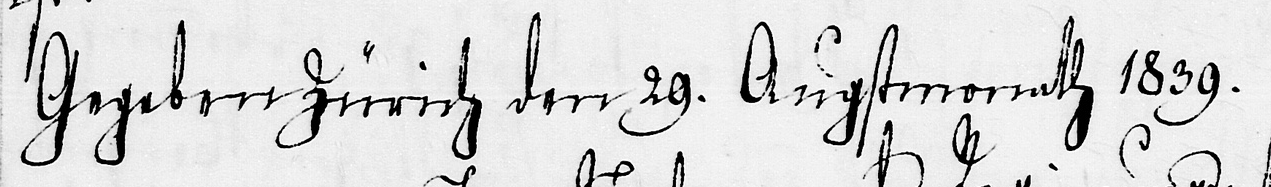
Gegeben Zürich den 29. Augstmonath 1839.
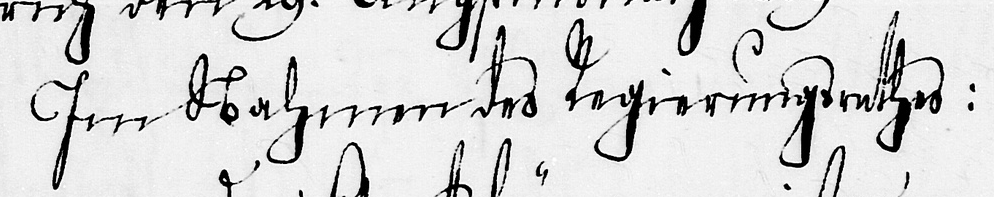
Im Nahmen des Regierungsrathes:
